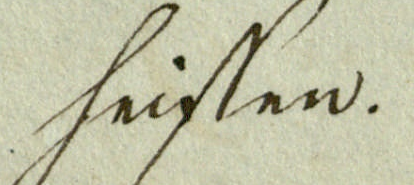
heissen.
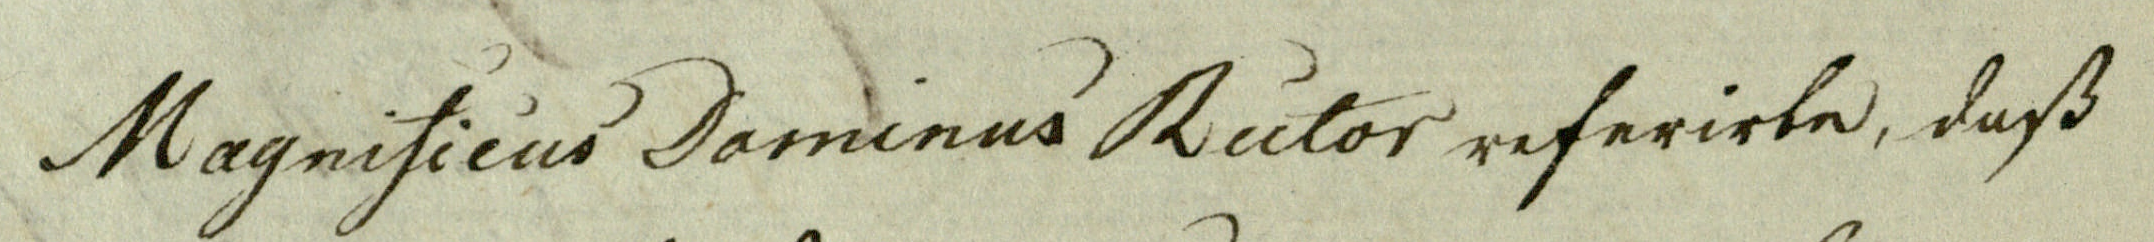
Magnificus Dominus Rector referirte, daß
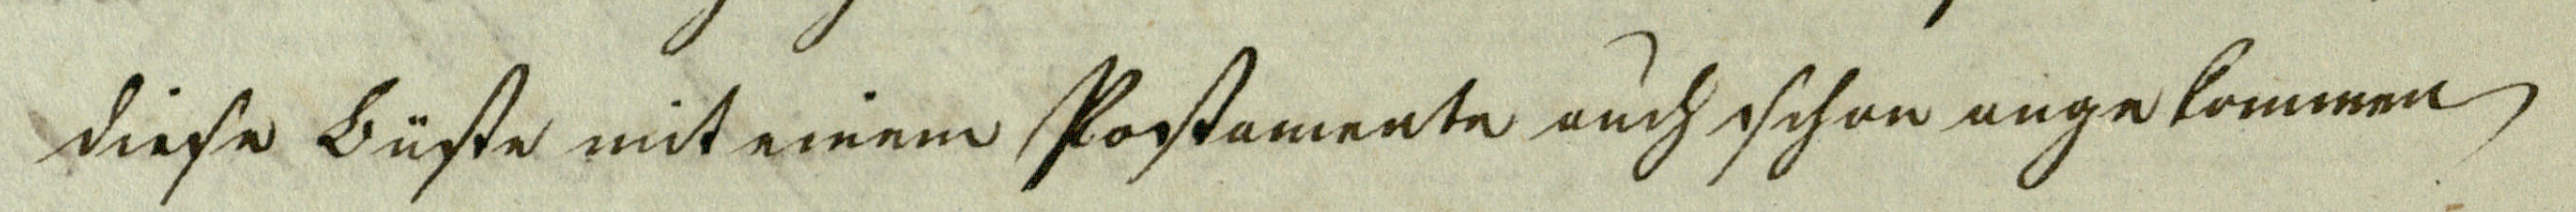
diese Büste mit einem Postamente auch schon angekommen
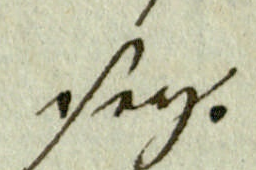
sey.
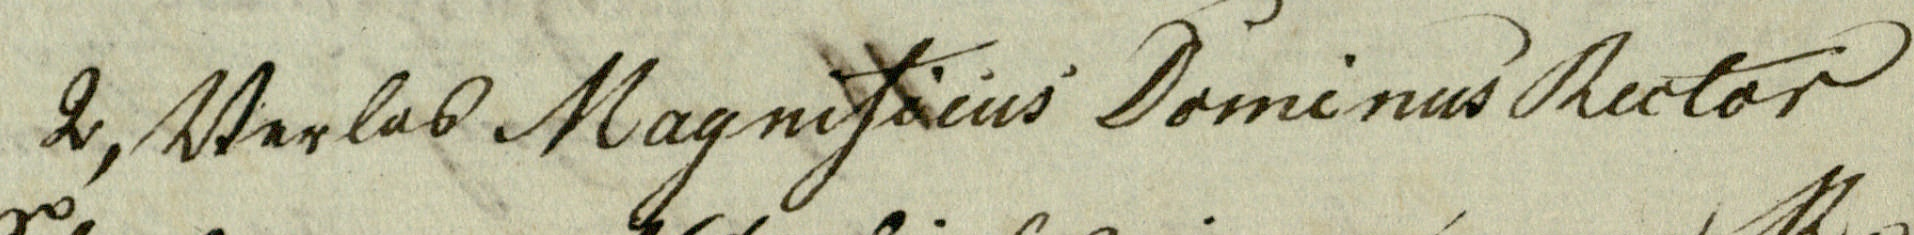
2, Verlas Magnificus Dominus Rector
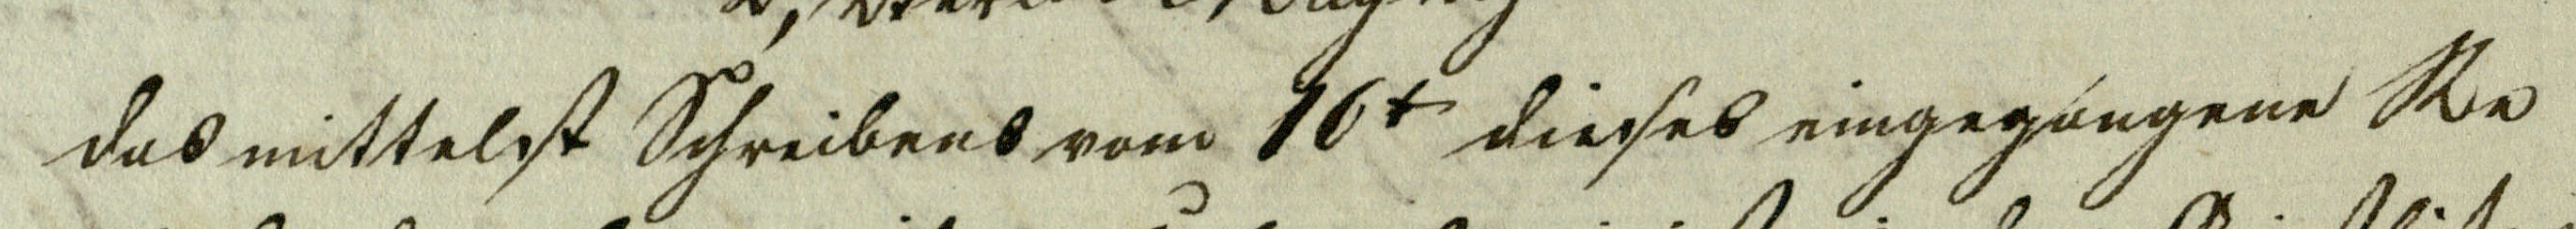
das mittelst Schreibens vom 16ten dieses eingegangene Re¬
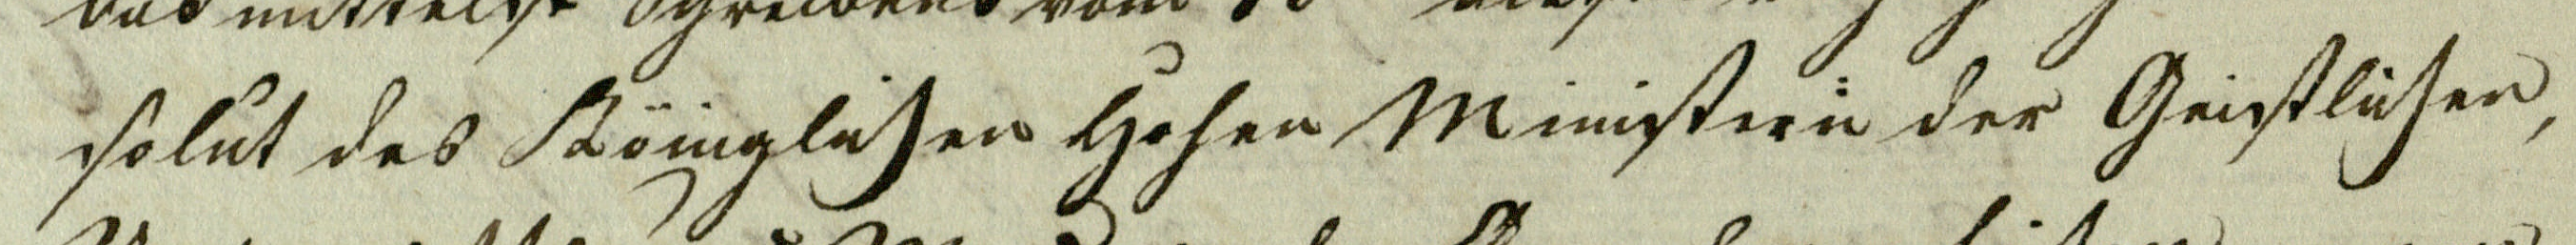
solut des Königlichen Hohen Ministerii der Geistlichen,
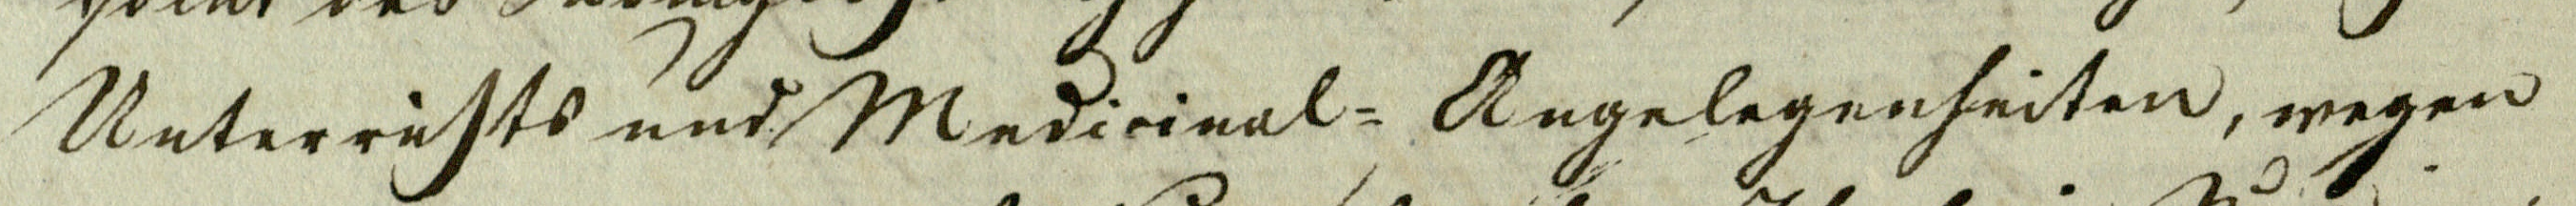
Unterrichts und Medicinal-Angelegenheiten, wegen
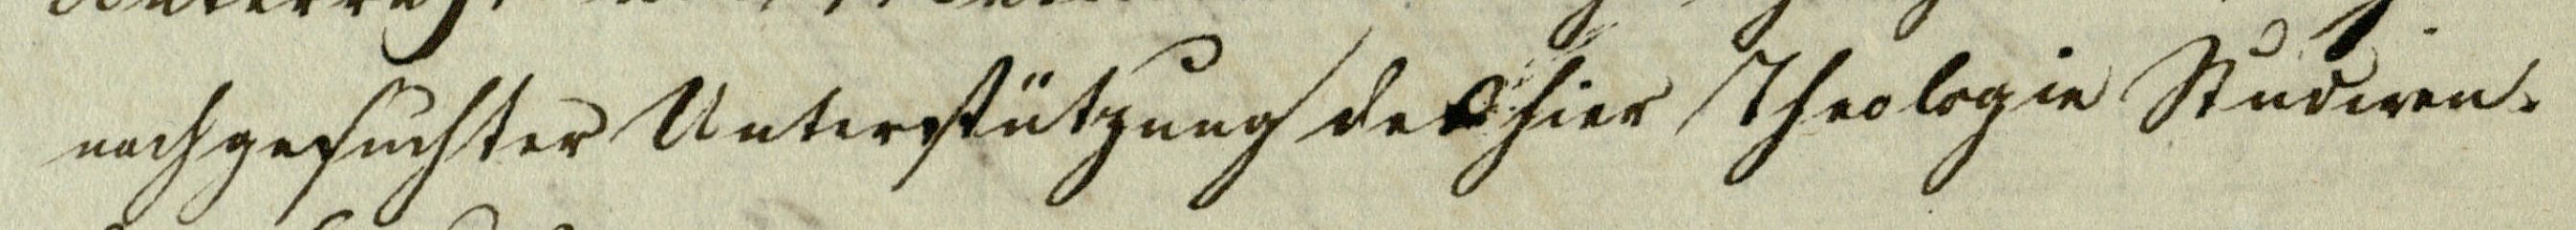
nachgesuchter Unterstützung des hier Theologie Studiren¬
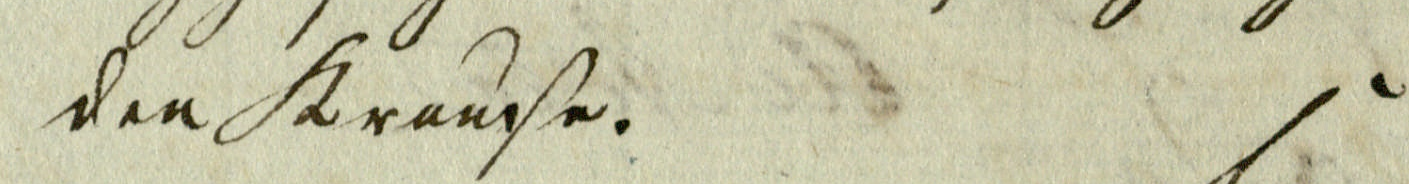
den Krause.
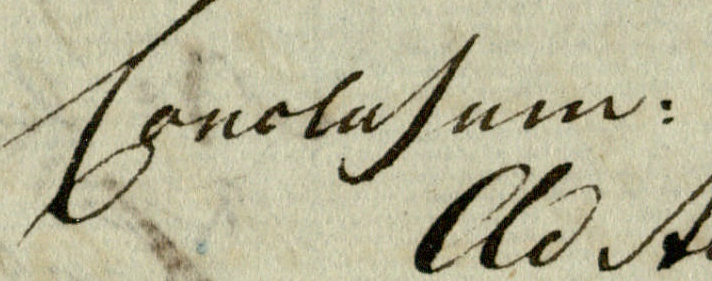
Conclusum:
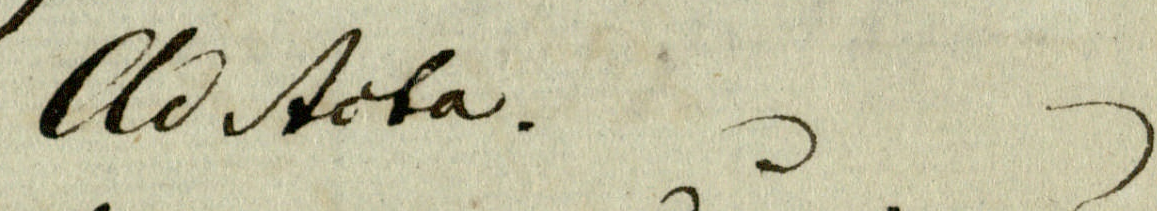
Ad Acta.
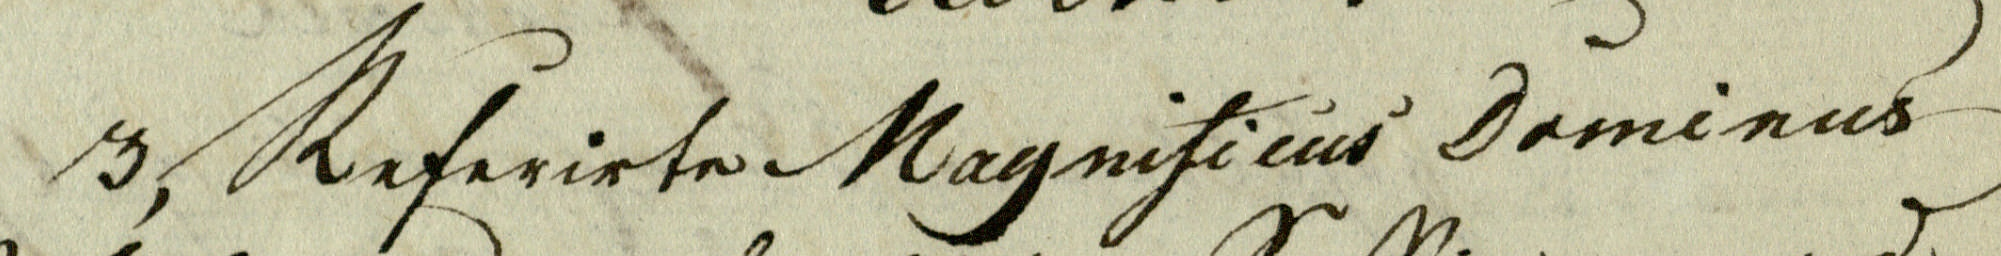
3, Referirte Magnificus Dominus
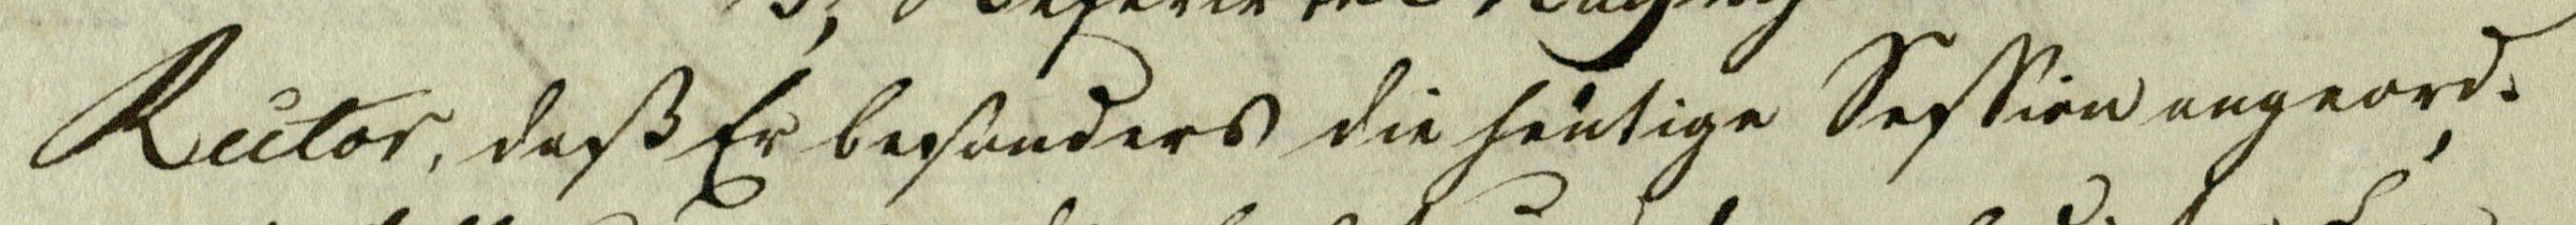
Rector, daß Er besonders die heutige Session angeord¬
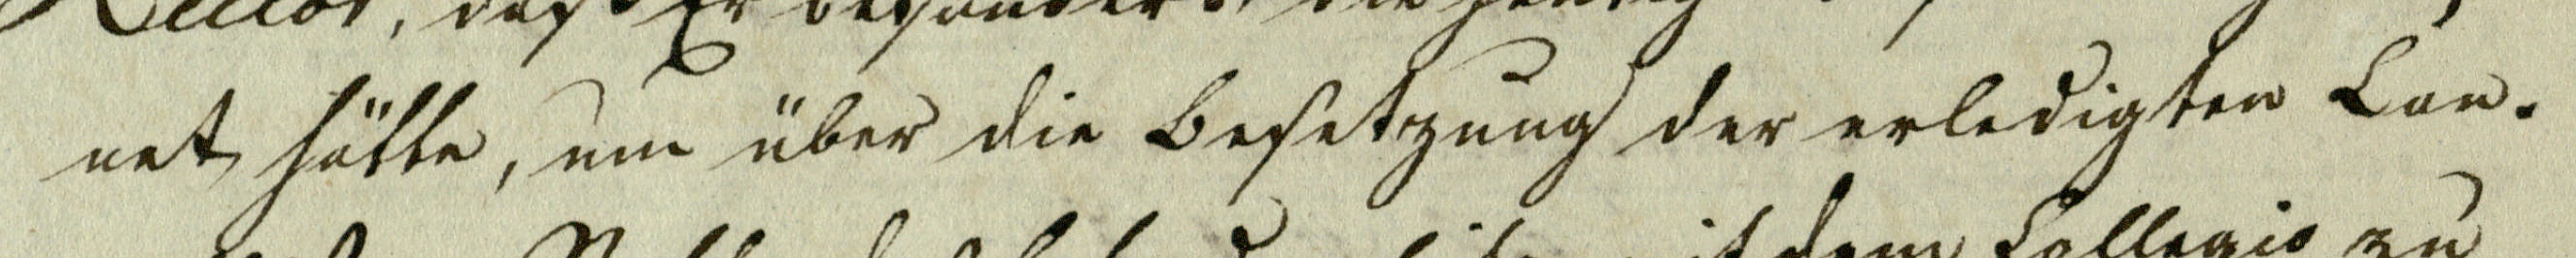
net hätte, um über die Besetzung der erledigten Can¬
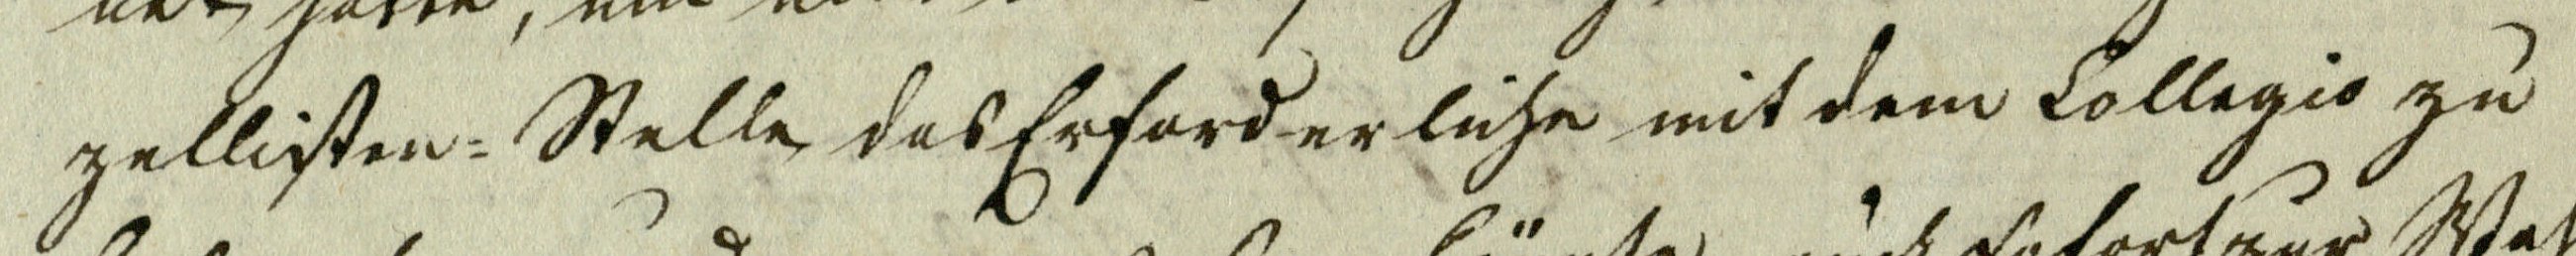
zellisten-Stelle das Erforderliche mit dem Collegio zu
